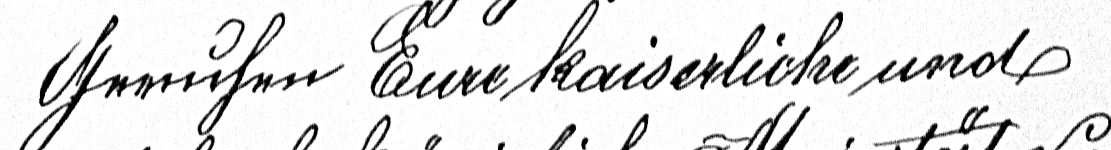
Geruhen Eure kaiserliche und
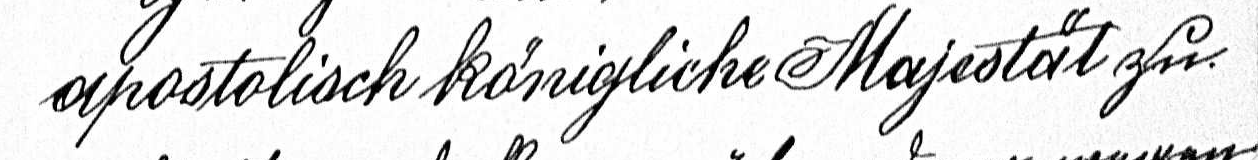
apostolisch königliche Majestät zu
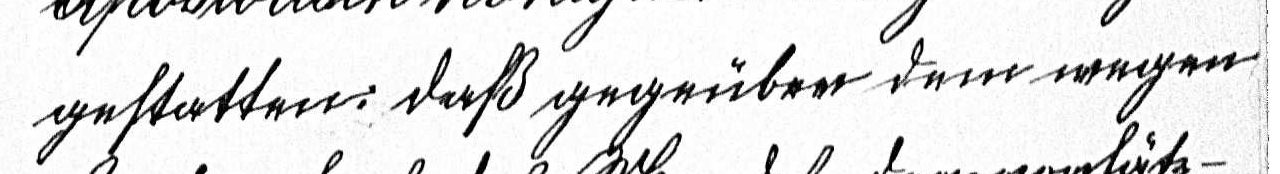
gestatten: daß gegenüber dem wegen
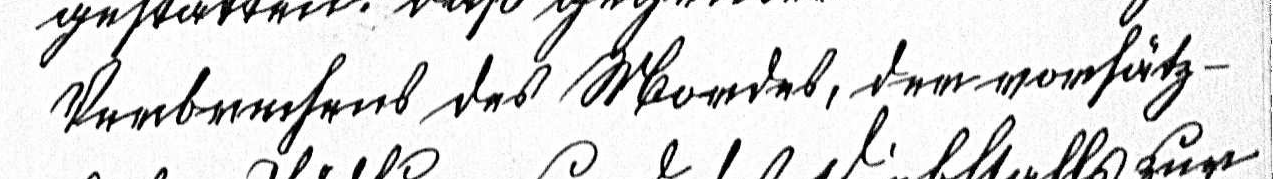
Verbrechens des Mordes, der vorsätz¬
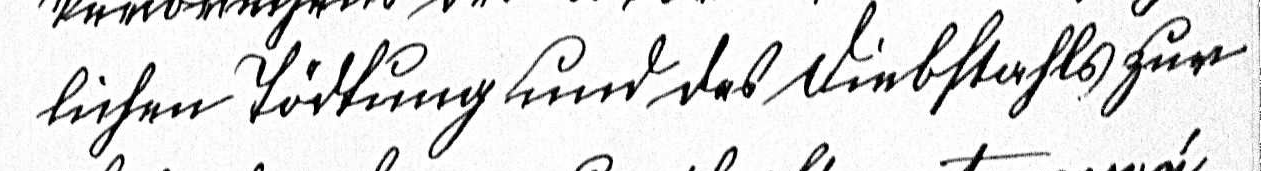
lichen Tödtung und des Diebstahls zur
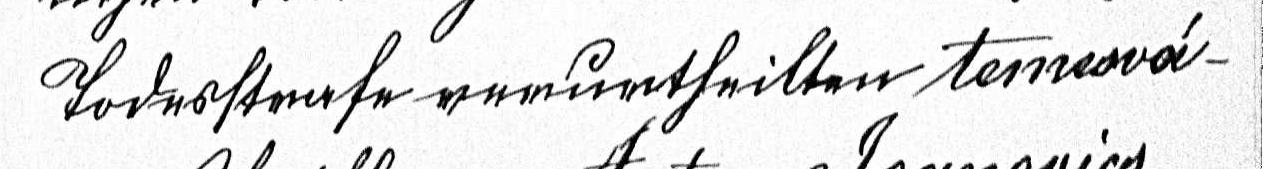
Todesstrafe verurtheilten temesvá¬
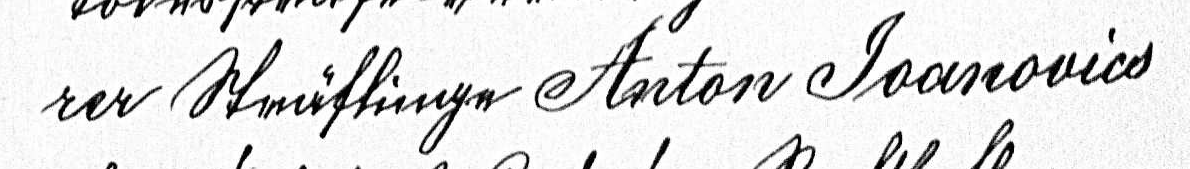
rer Sträflinge Anton Ioanovics
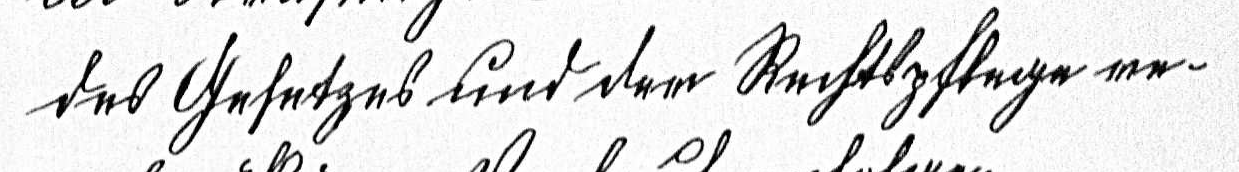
des Geseetzes und der Rechtspflege re¬
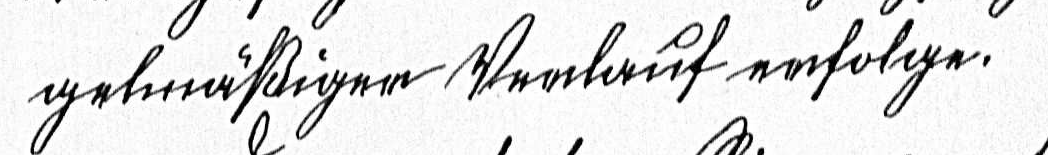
gelmäßiger Verlauf erfolge.
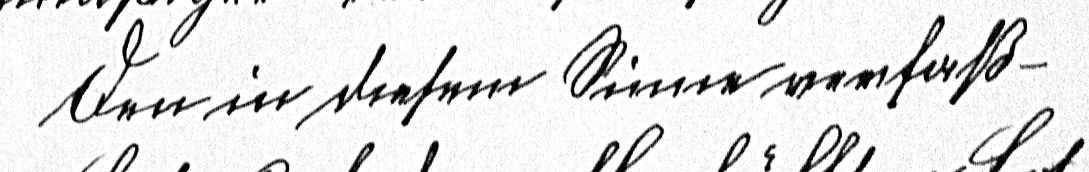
Den in diesem Sinne verfaß¬
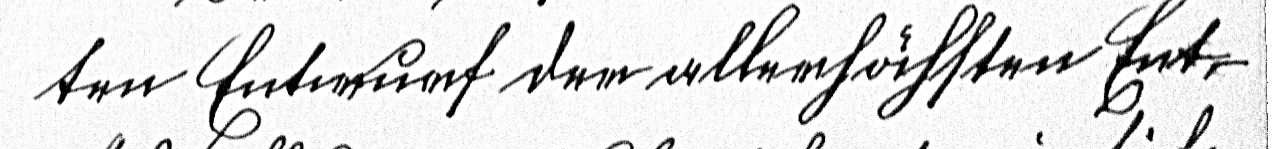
ten Entwurf der allerhöchsten Ent¬
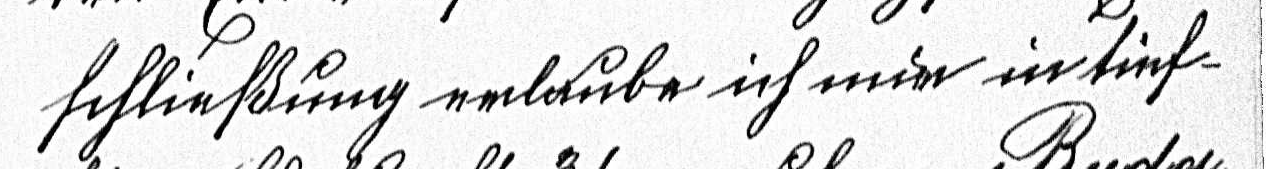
schließung erlaube ich mir in tief¬
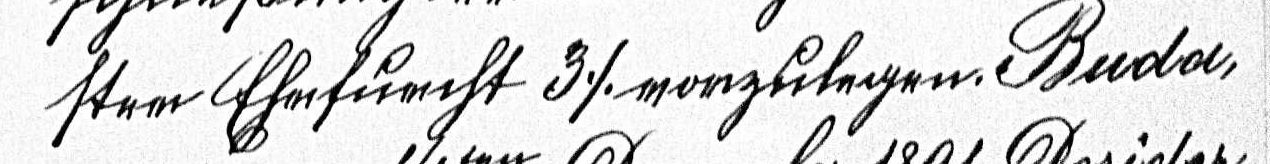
ster Ehrfurcht 3) vorzulegen. Buda¬
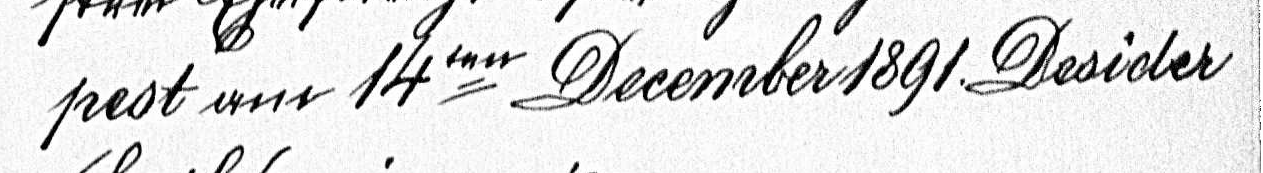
pest am 14ten December 1891 Desider
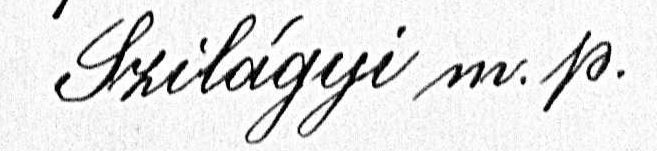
Szilágyi m.p.
